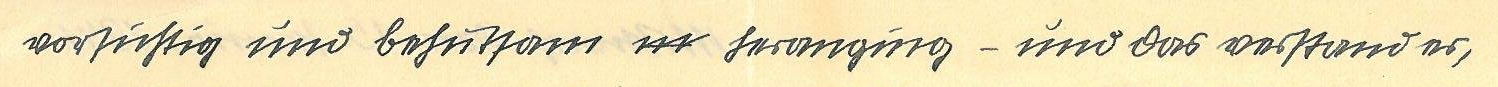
vorsichtig und behutsam m heranging – und das verstand er,
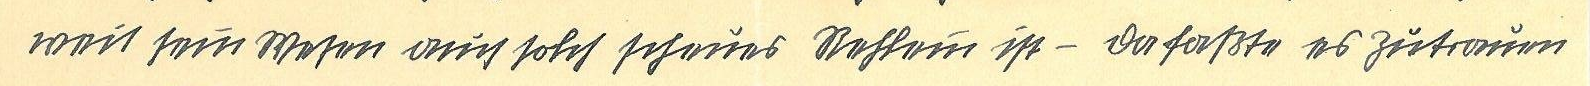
weil sein Wesen auch solch scheues Rehlein ist – da faßte es Zutrauen
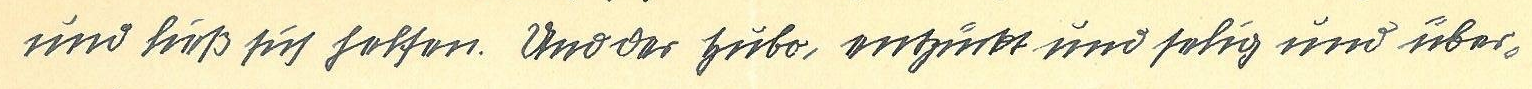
und ließ sich helfen. Und der Hubo, entzückt und selig und über¬
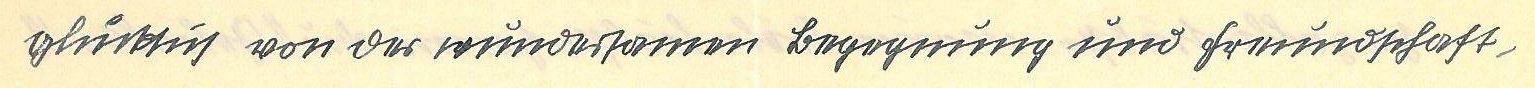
glücklich von der wundersamen Begegnung und Freundschaft,
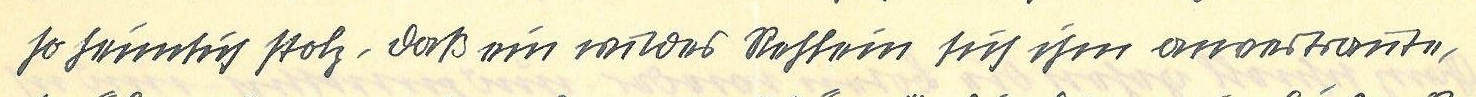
so heimlich stolz, daß ein wildes Rehlein sich ihm anvertraute,
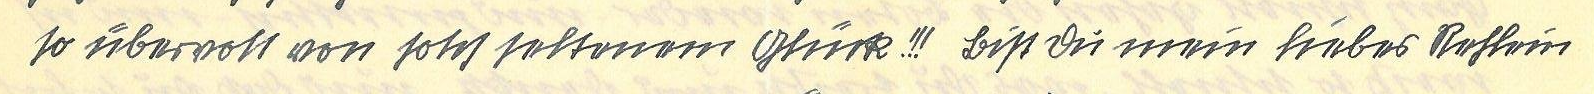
so übervoll von solch seltenem Glück!!! Bist Du mein liebes Rehlein
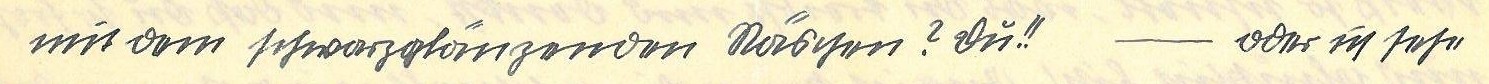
mit dem schwarzglänzenden Näschen? Du!! —— oder ich sehe
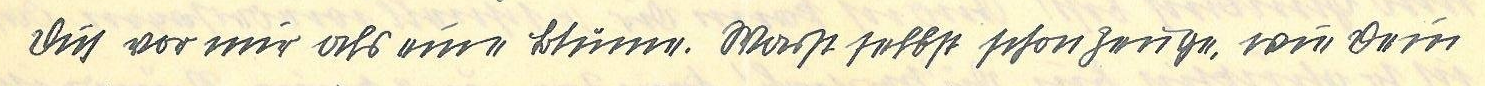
Dich vor mir als eine Blume. Warst selbst schon Zeuge, wie Dein
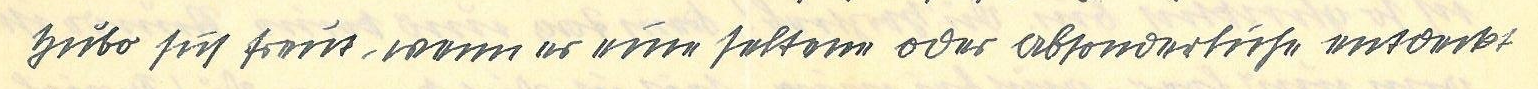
Hubo sich freut, wenn er eine seltene oder absonderliche entdeckt
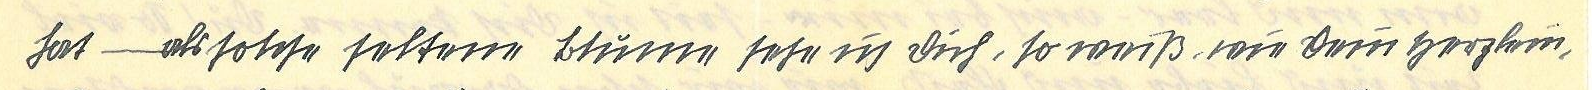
hat —— als solche seltene Blume sehe ich Dich, so weiß, wie Dein Herzlein,
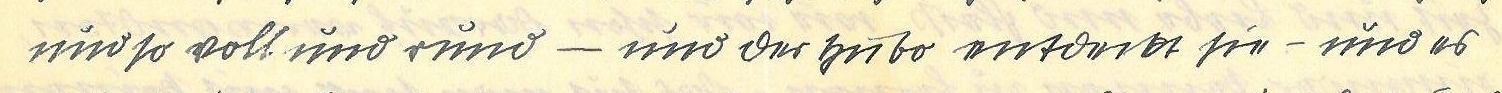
und so voll und rund — und der Hubo entdeckt sie – und es
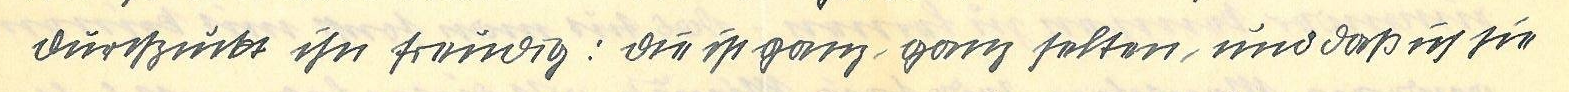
durchzuckt ihn freudig: die ist ganz, ganz selten, und daß ich sie
